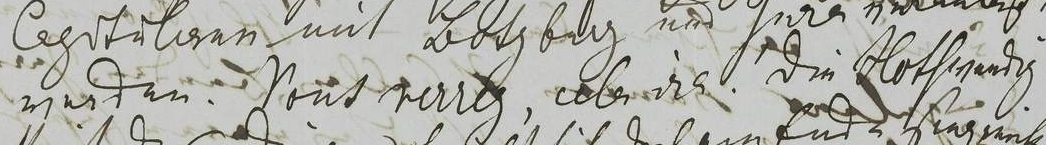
werden. Vous verrez, cela ira! Die Nothwendig-
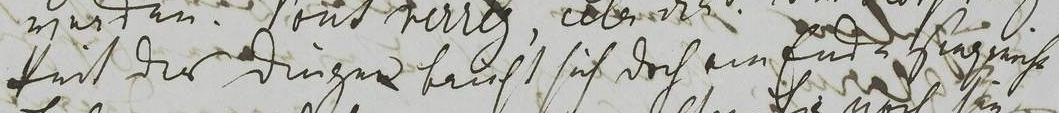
keit der Dinge bricht sich doch am Ende siegreiche
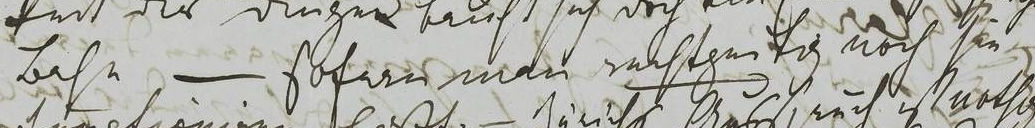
Bahn – sofern man rechtzeitig noch sie
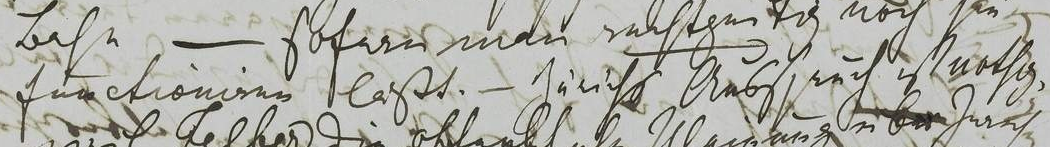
functioniren läßt. – Zürichs Ausspruch ist nöthig,
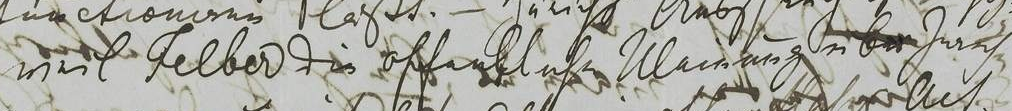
weil Felber die öffentliche Meinung über Zürich
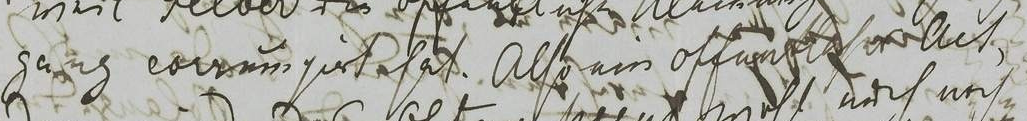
ganz corrumpirt hat. Also ein öffentlicher Act,
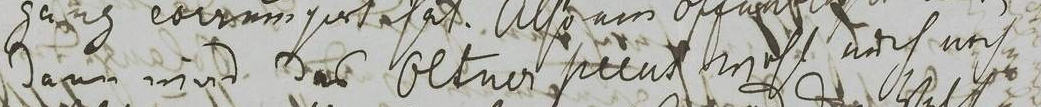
dann wird das Oltner pecus wohl auch noch
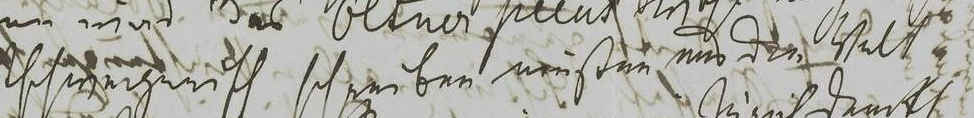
ostschweizerisch schreiben müßen und die Welt
